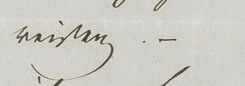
reisen. –
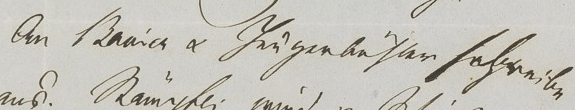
An Bavier & Hungerbühler schreibe
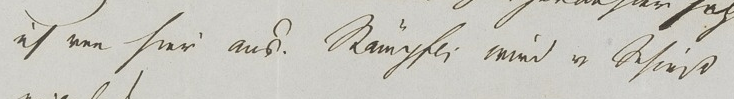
ich von hier aus. Stämpfli wird v Schieß
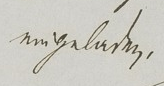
eingeladen.
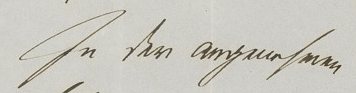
In der angenehmen
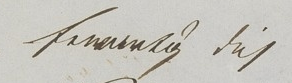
Erwartung dich
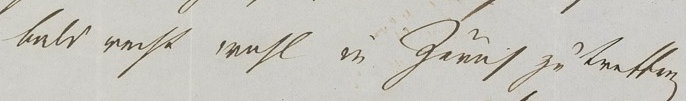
bald recht wohl in Zürich zu treffen
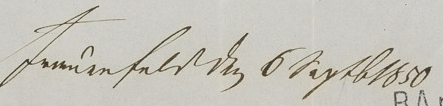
Frauenfeld den 6 Septb
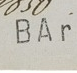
1850.
